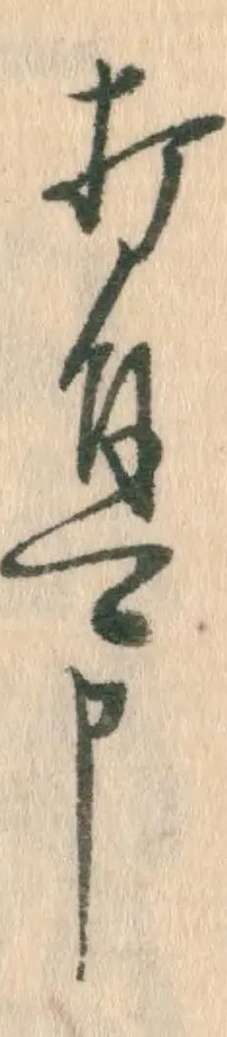打付可申
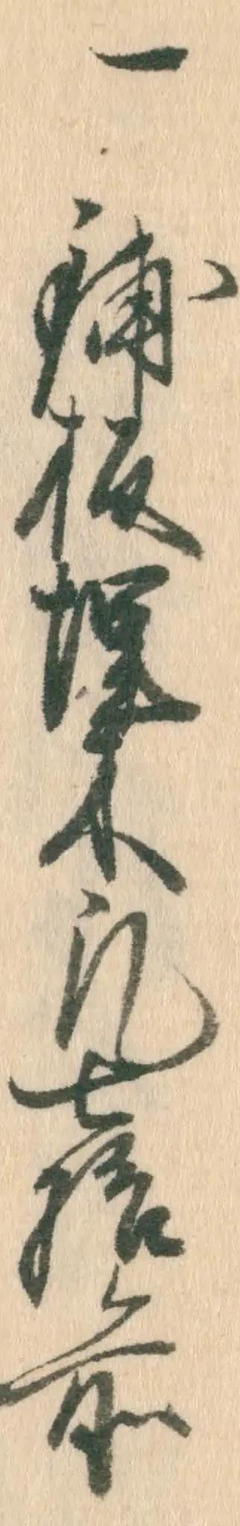一鋪板埋木凡七拾ケ所
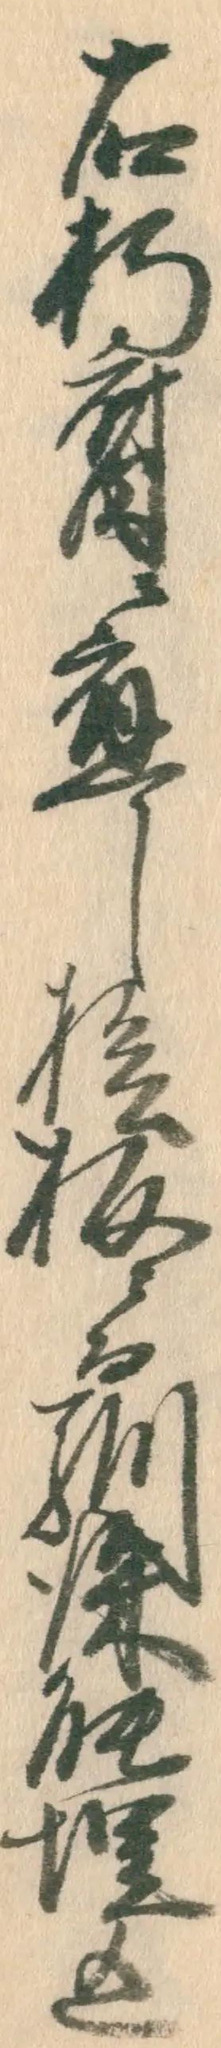右朽腐ニ応し桧板ニ而馴染能埋込
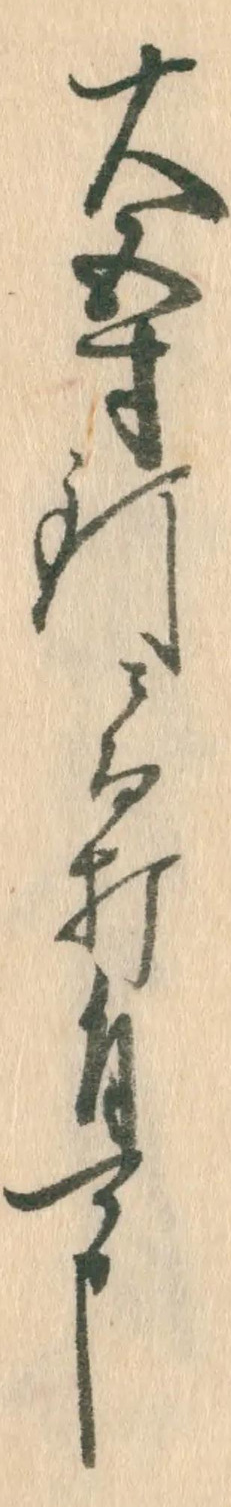大五寸釘ニ而打付可申

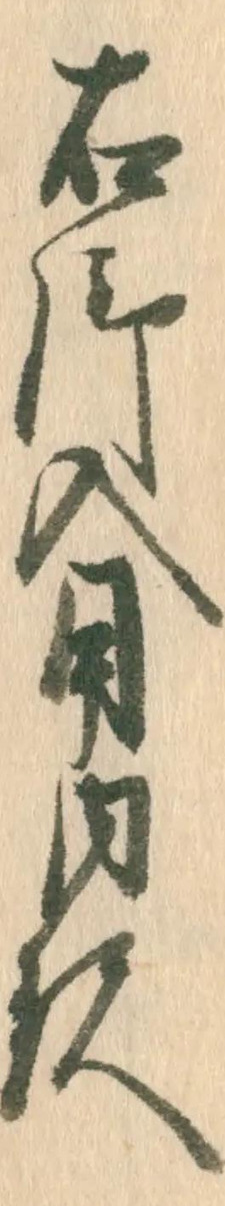右御入用内訳
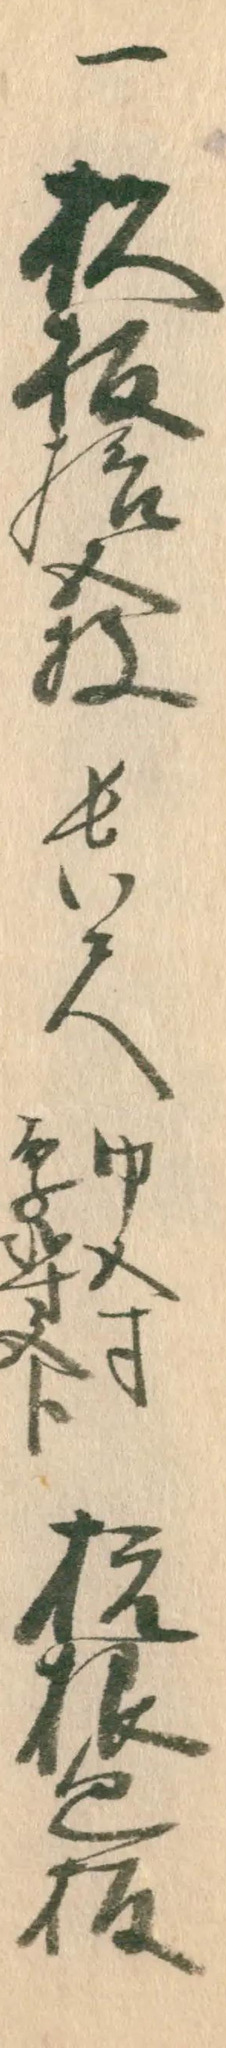一杉板拾五枚長八尺巾五寸杭根包板
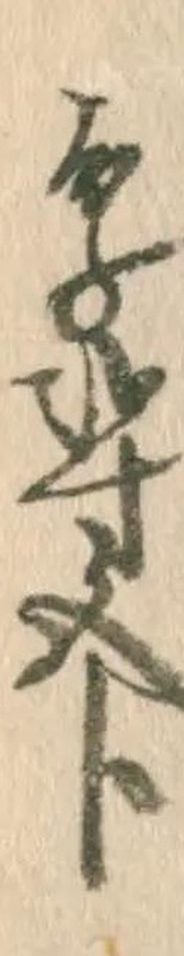厚弐寸五分
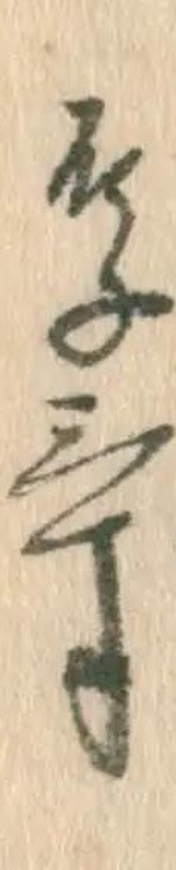厚三寸
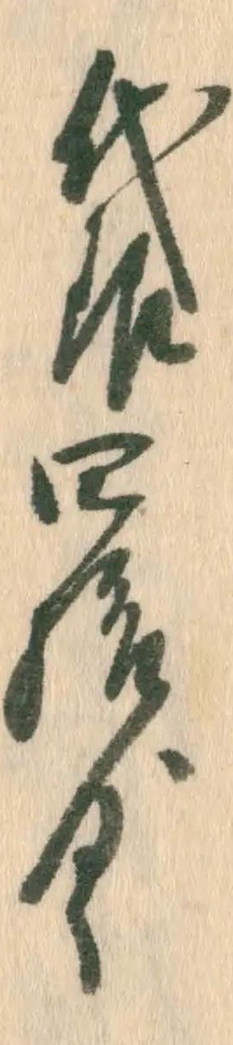代銀四拾匁但壱枚銀四匁
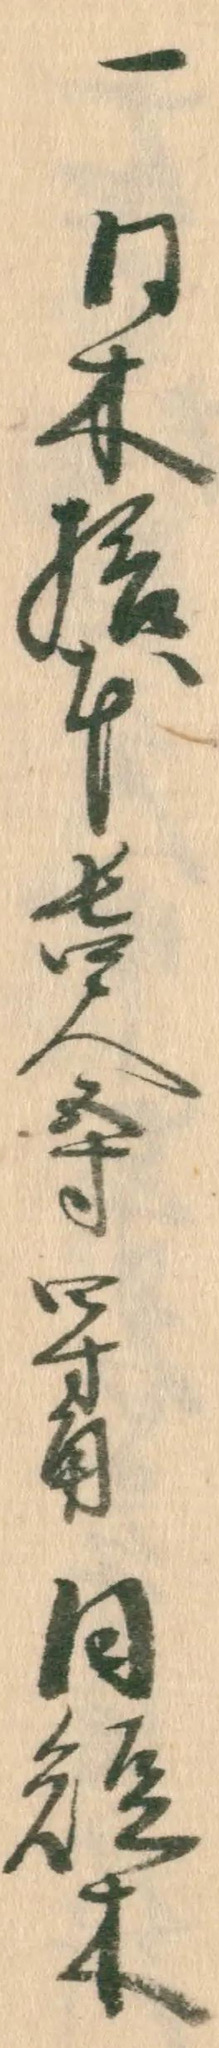一同木拾本長四尺五寸四寸角同短木
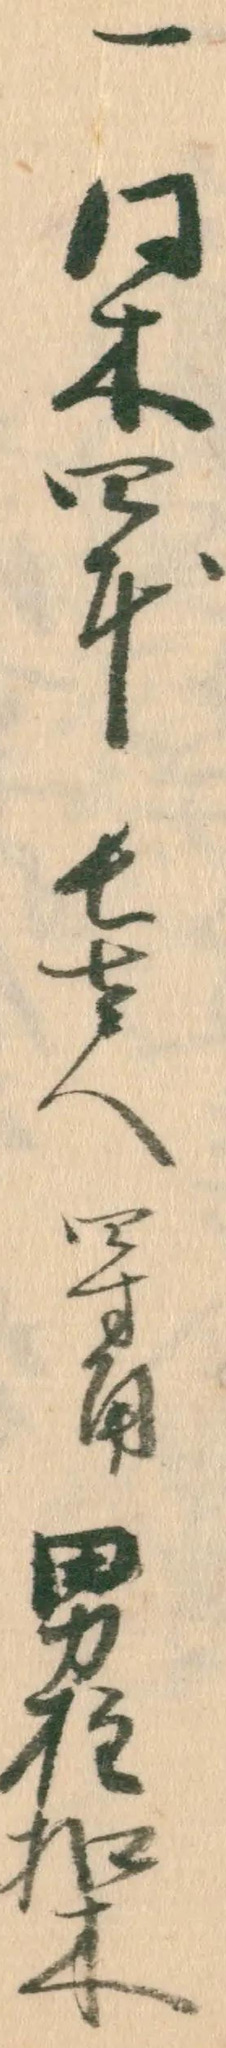一同木四本長七尺四寸角男柱扣木
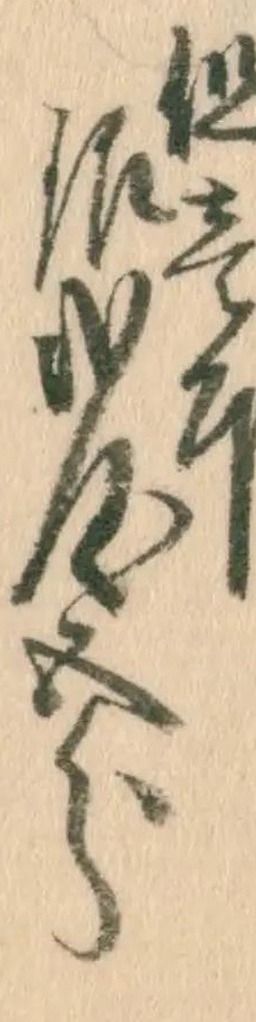厚弐寸五分
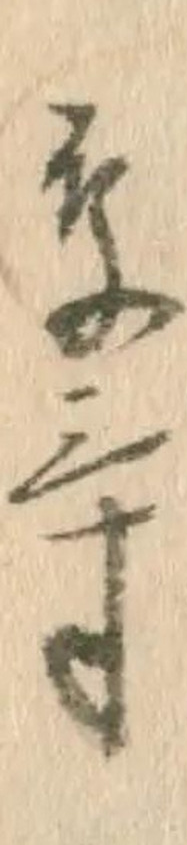厚三寸

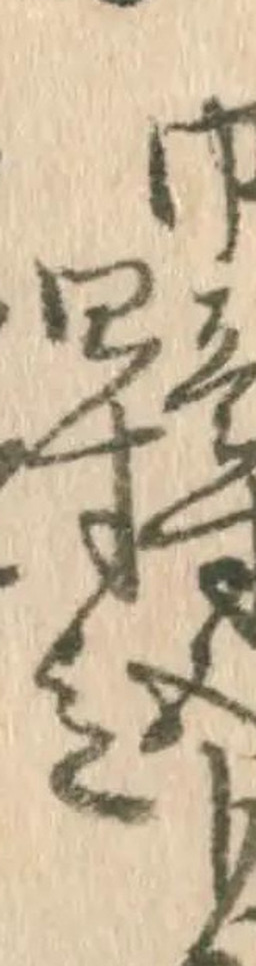四寸迄
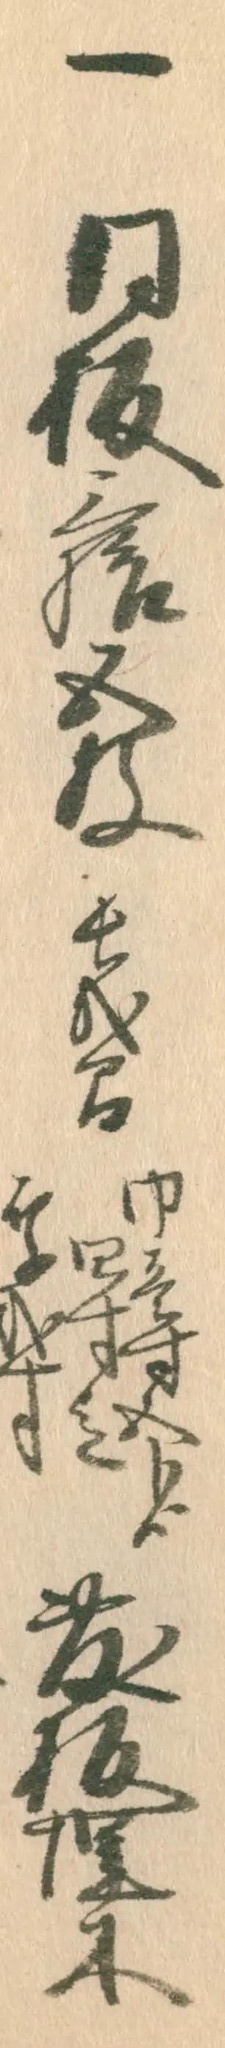一同板三拾五枚長弐間巾壱寸五分ゟ敷板埋木
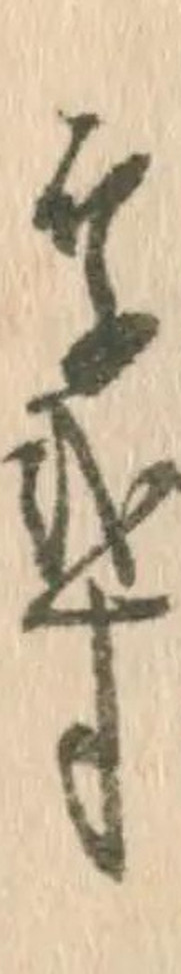厚弐寸
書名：三橋 17巻. [8] 三橋小破御修復書留　但御奉行御掛リ替地震潰橋番屋　嘉永四亥年より安政二卯年迄　下
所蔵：国立国会図書館 National Diet Library, JAPAN
